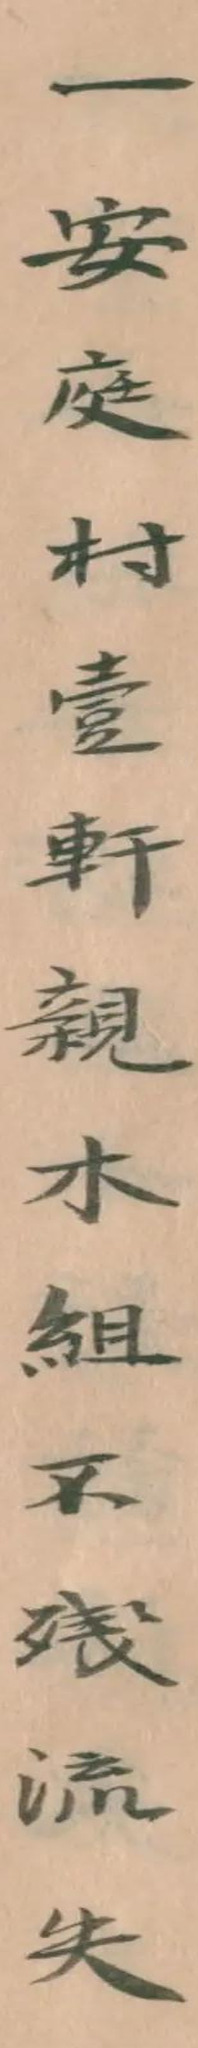一安庭村壹軒親木組不残流失
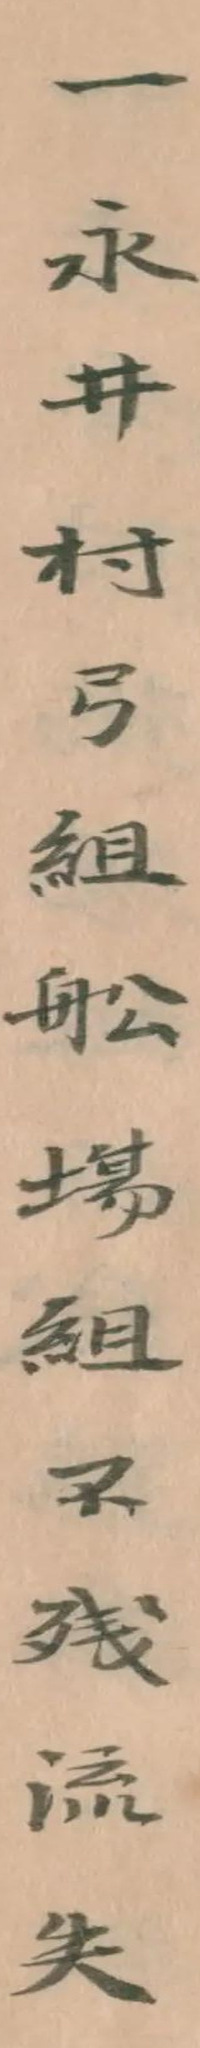一永井村弓組船場組不残流失
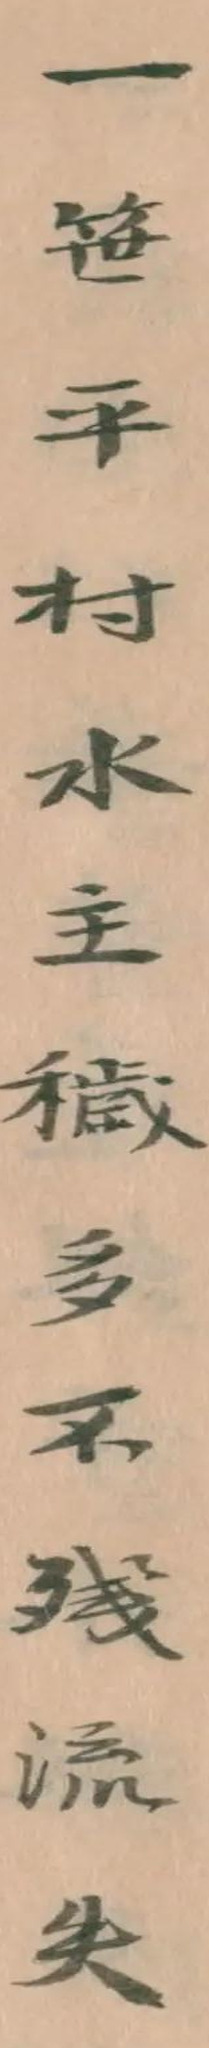一笹平村水主穢多不残流失
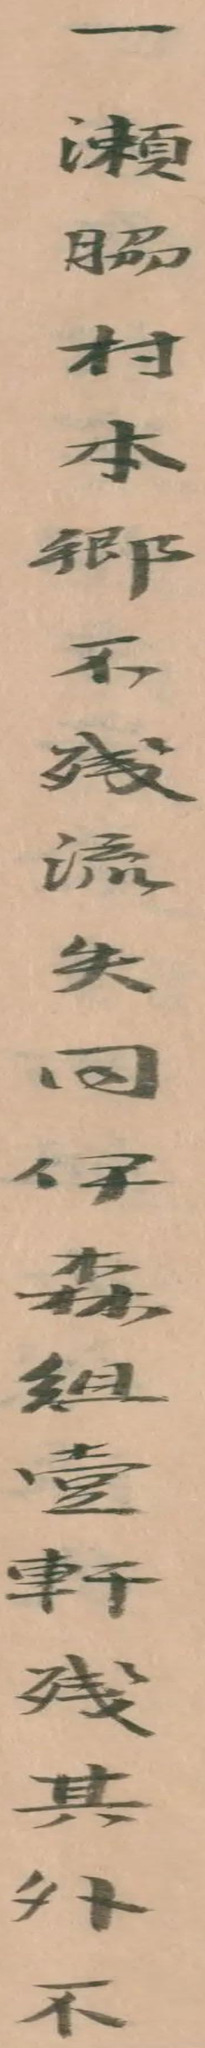一瀬脇村本郷不残流失同伊森組壹軒残其外不
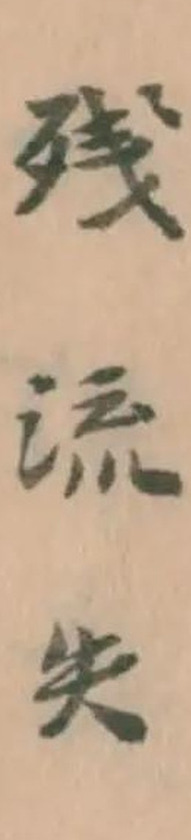残流失
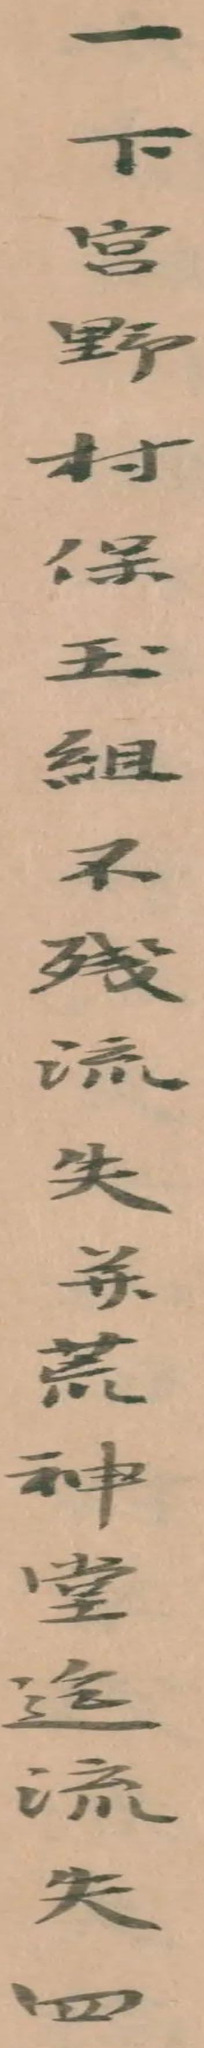一下宮野村保玉組不残流失并荒神堂迄流失四
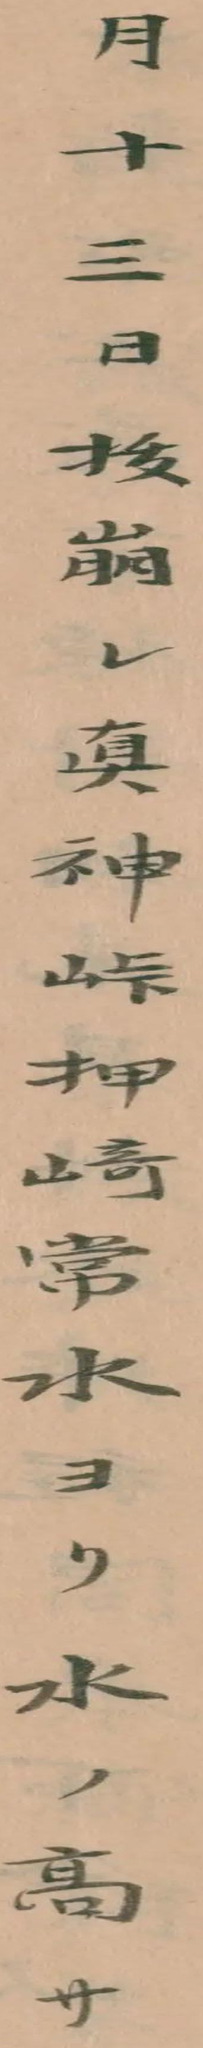月十三日抜崩レ真神峠押崎常水ヨリ水ノ高サ
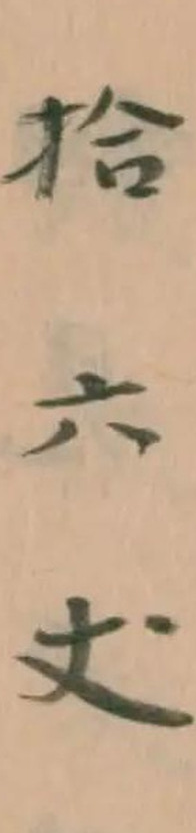拾六丈
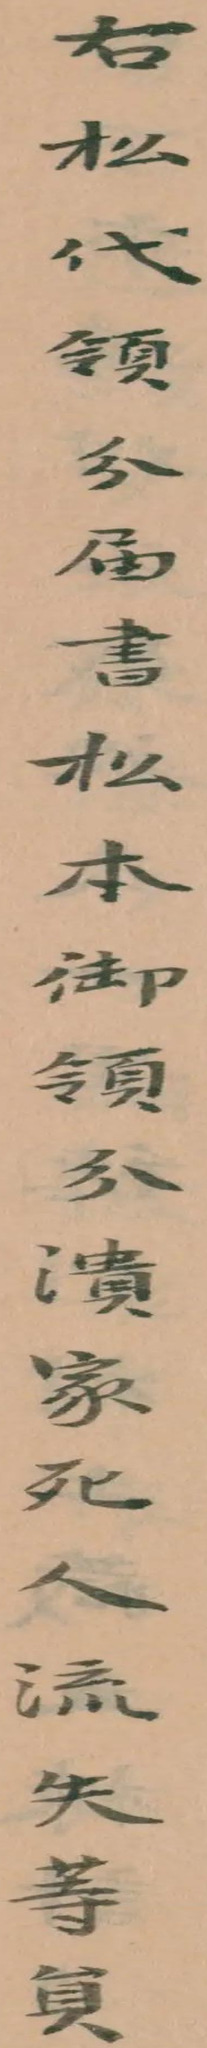右松代領分届書松本御領分潰家死人流失等員
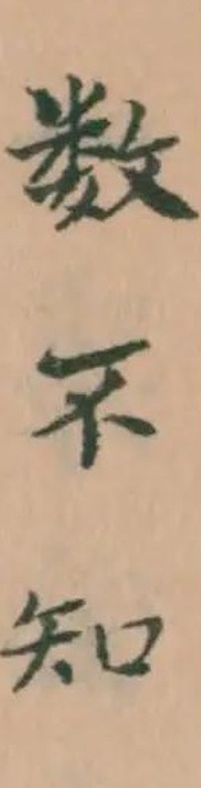数不知
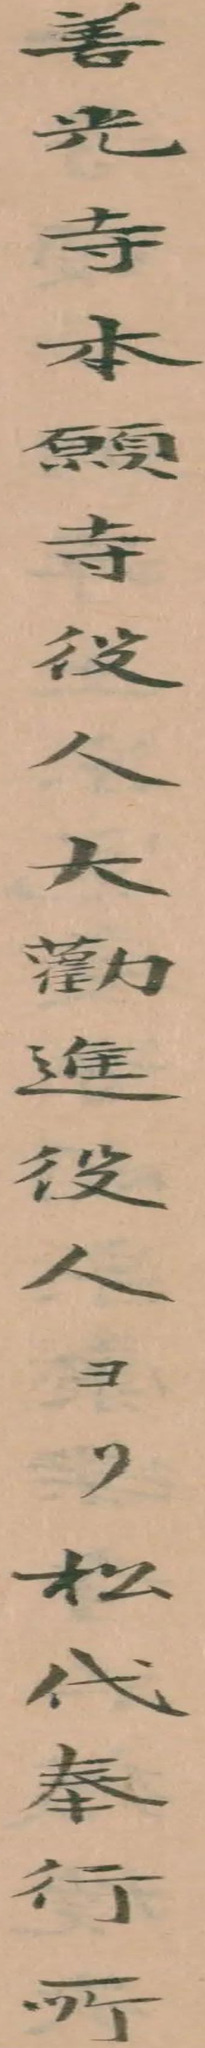善光寺本願寺役人大勧進役人ヨリ松代奉行所
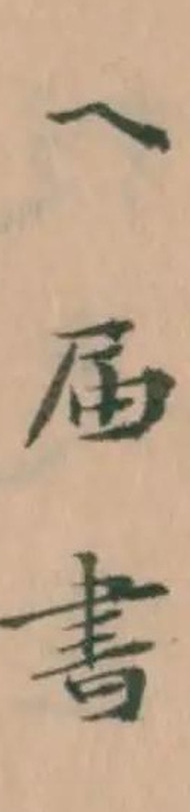ヘ届書
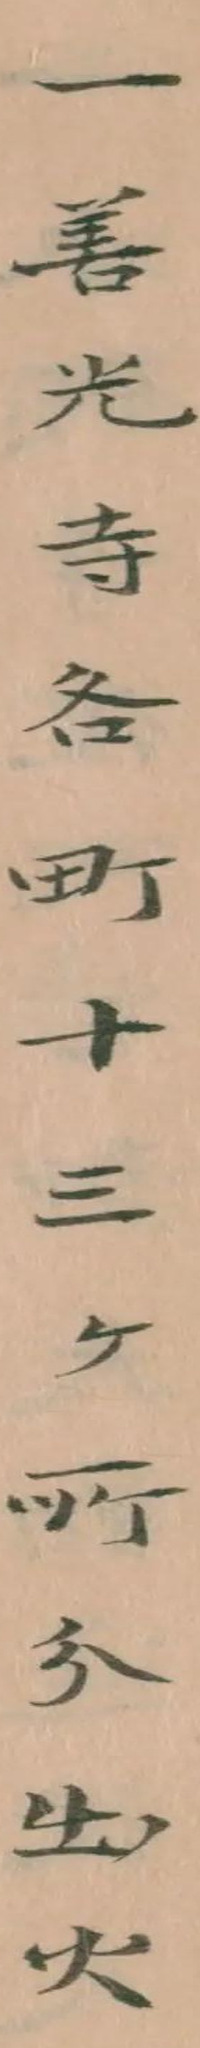一善光寺各町十三ケ所分出火
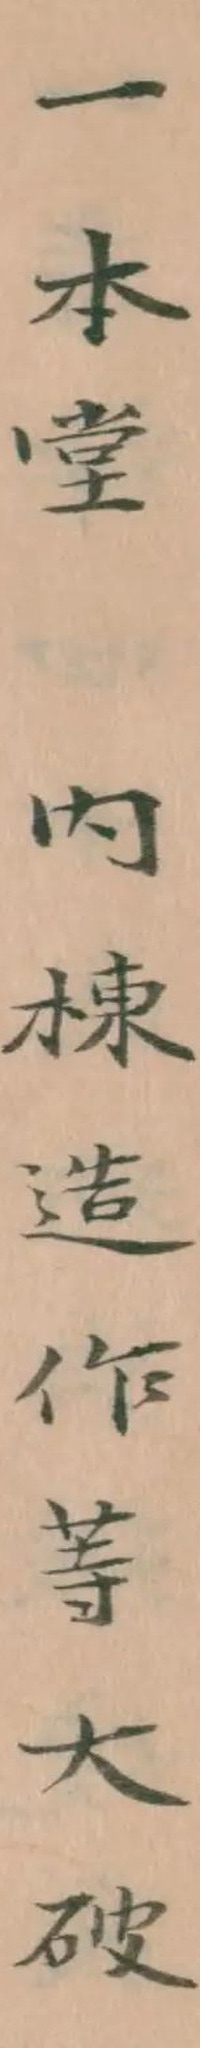一本堂内棟造作等大破
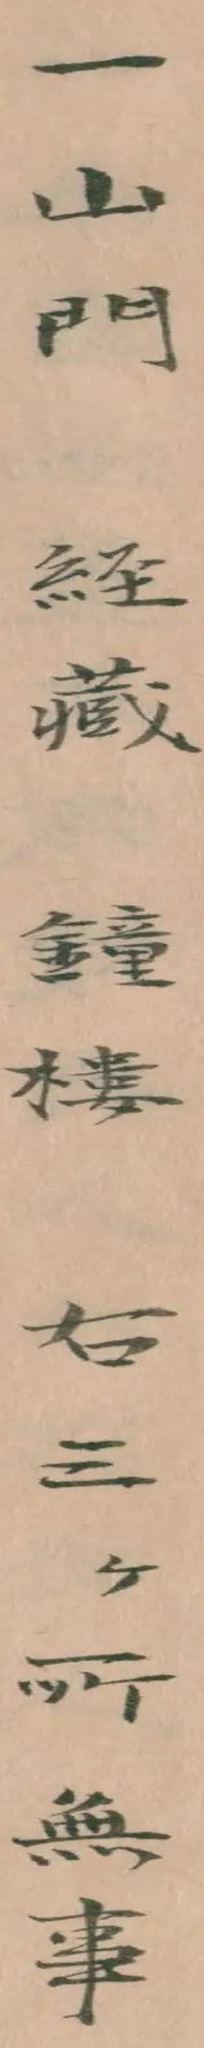一山門経藏鐘楼右三ヶ所無事
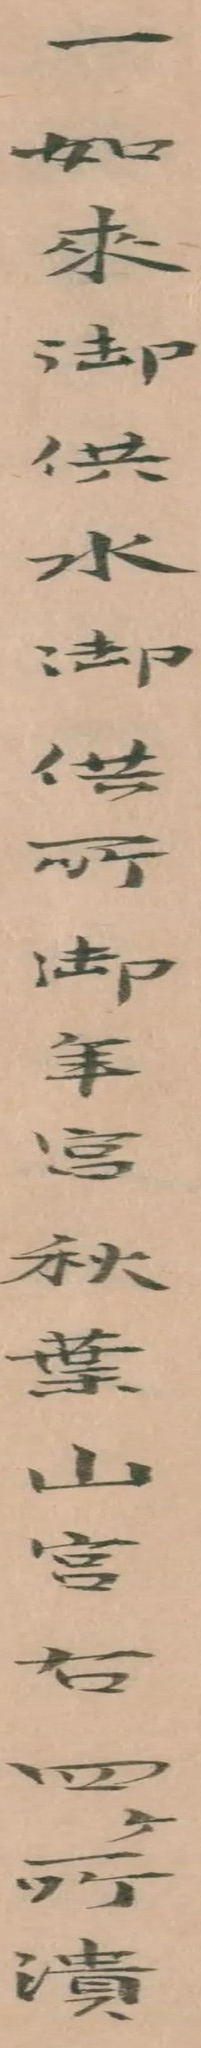一如来御供水御供所御年宮秋葉山宮右四ヶ所潰
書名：地災撮要. 巻5-6(地震之部)
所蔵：国立国会図書館 National Diet Library, JAPAN
